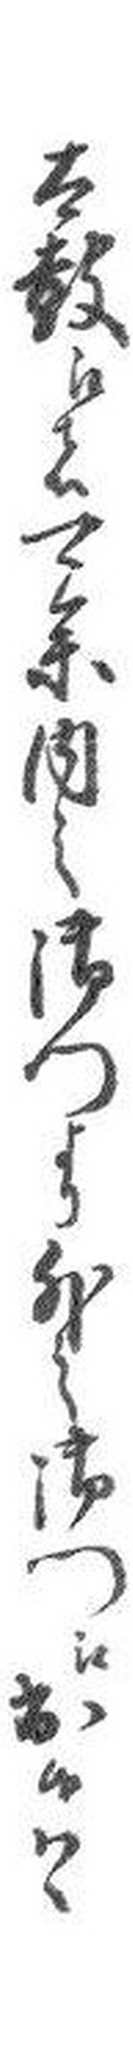太鼓江は可参内之御門より外之御門江出候ハ丶
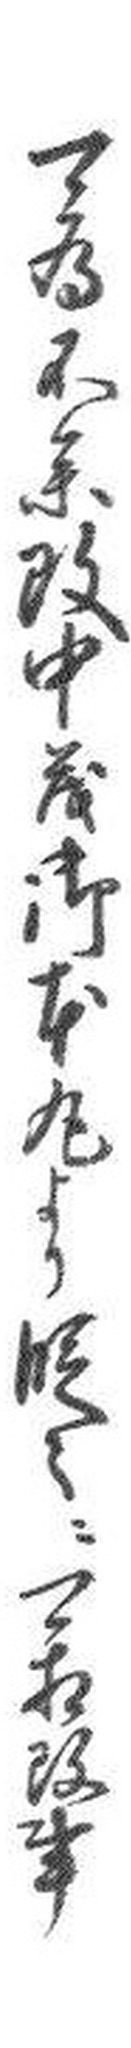可為不参改中も御本丸より段々ニ可相改事
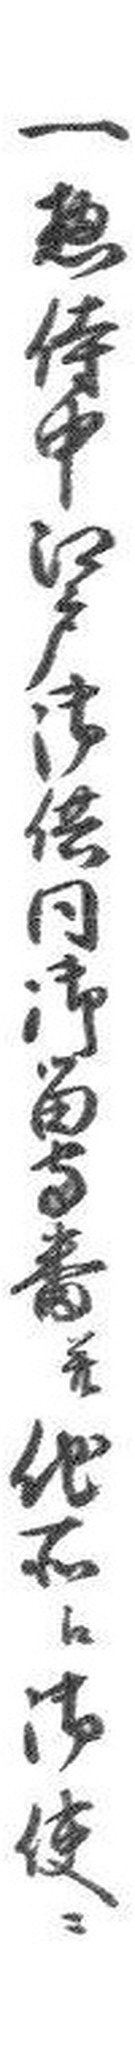一惣侍中江戸御供同御留守番并他所江御使ニ
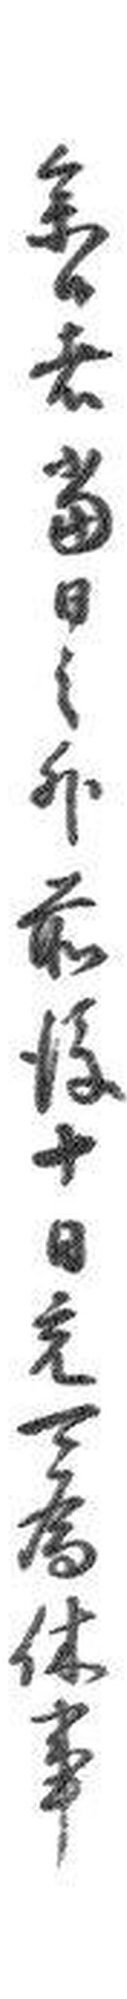参候者当日之外前後十日充可為休事
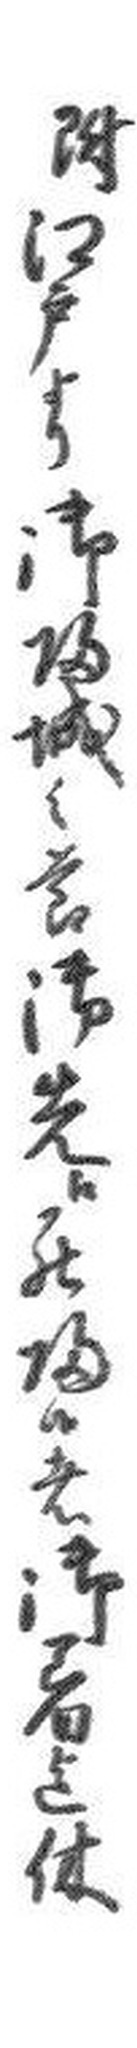附江戸より御帰城之節御先江罷帰候者御着迄休
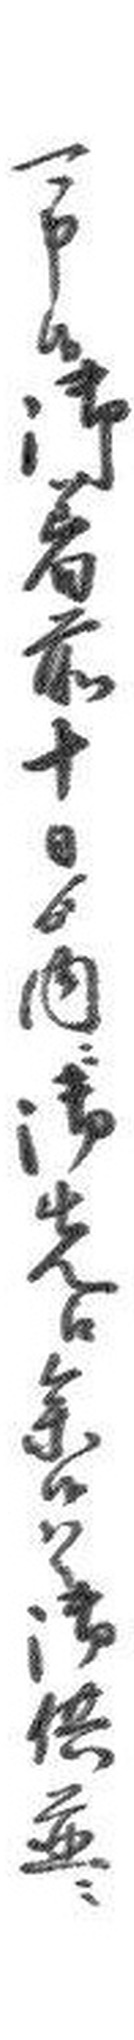可申候御着前十日ゟ内ニ御先江参候ハ丶御供並ニ
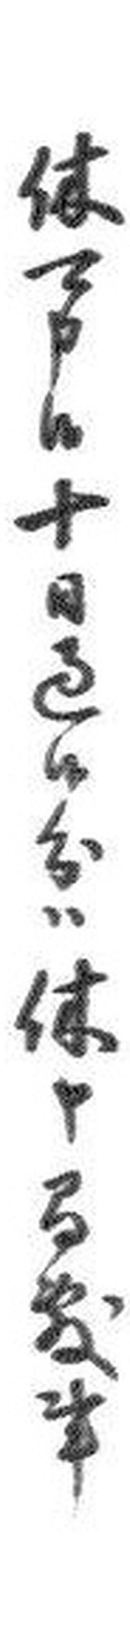休可申候十日過候分ハ休申間敷事
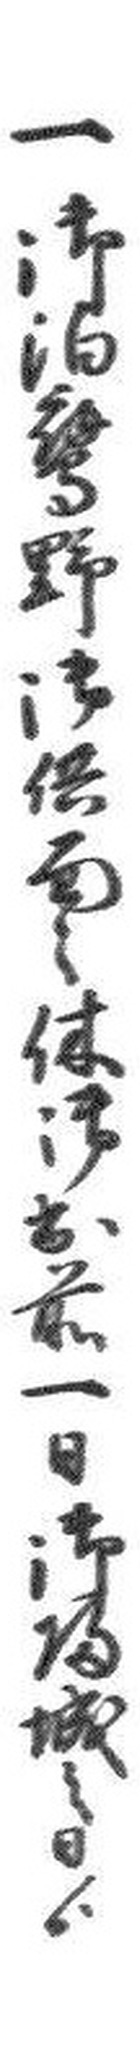一御泊鷹野御供面々休御出前一日御帰城之日ゟ
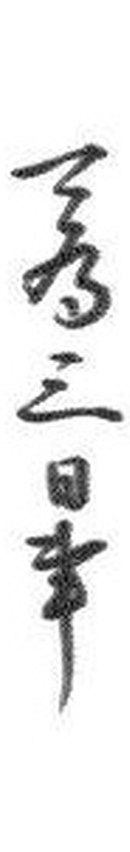可為三日事
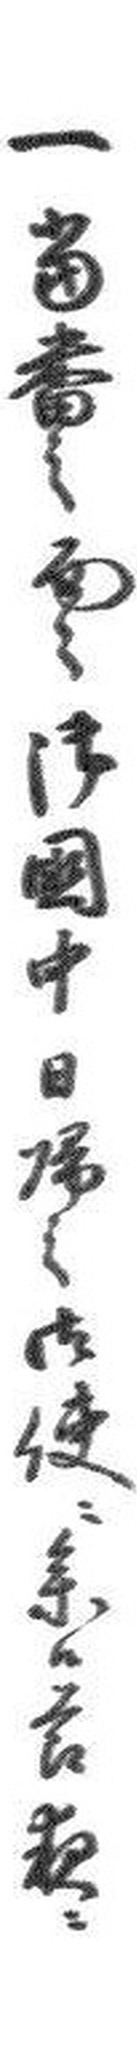一当番之面々御国中日帰之御使ニ参候節夜ニ
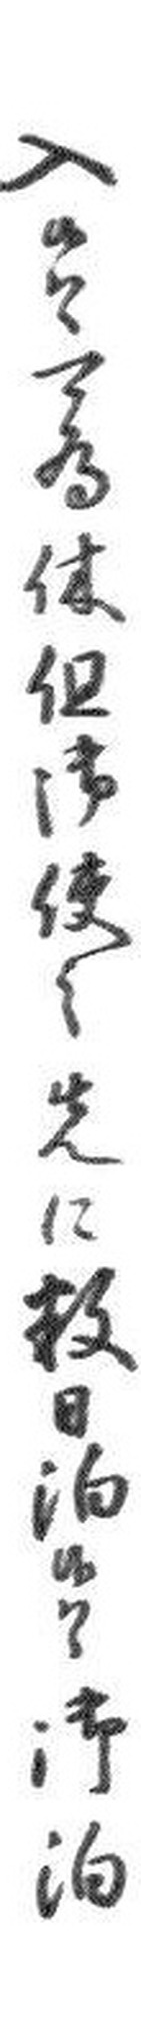入候ハ丶可為休但御使之先に数日泊候ハ丶御泊
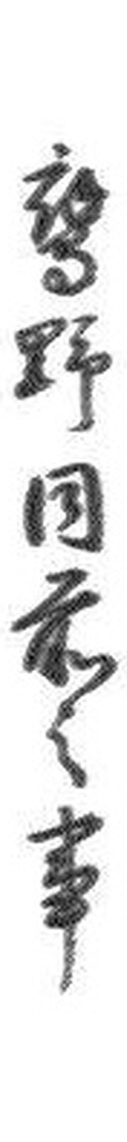鷹野同前之事

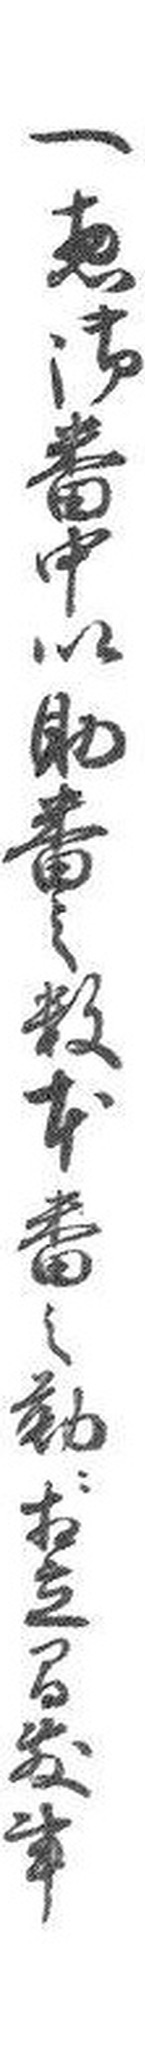一惣御番中以助番之数本番之勤ニ相立間敷事
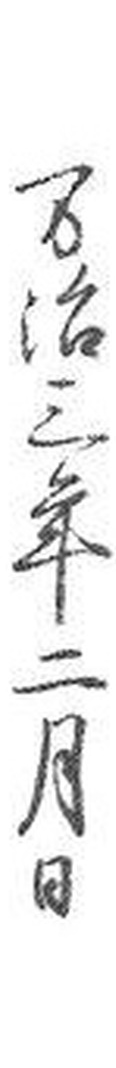万治三年二月日
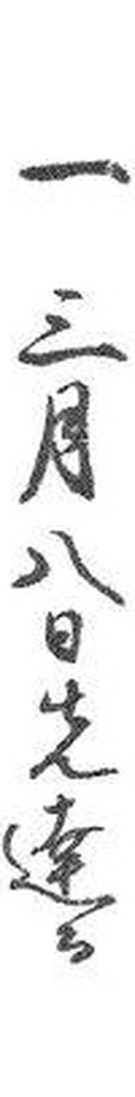一三月八日先達而
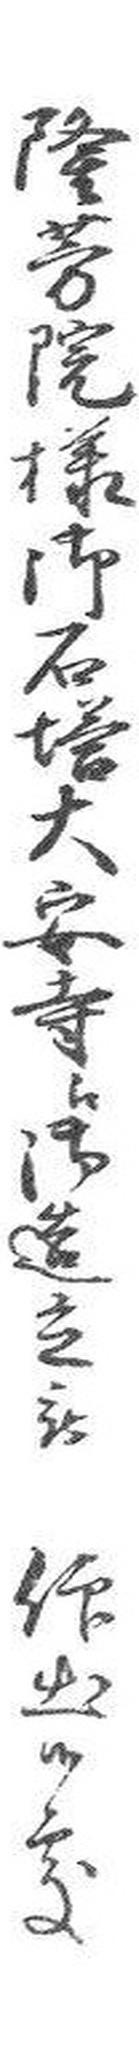隆芳院様御石塔大安寺江御造立被仰出候処
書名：家譜 六 光通公 従万治三年到寛文三年
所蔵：福井県文書館 Fukui Prefectural Archives
